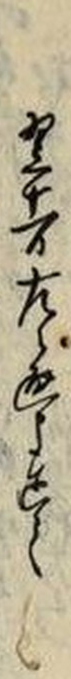翌十一日左之通申達之
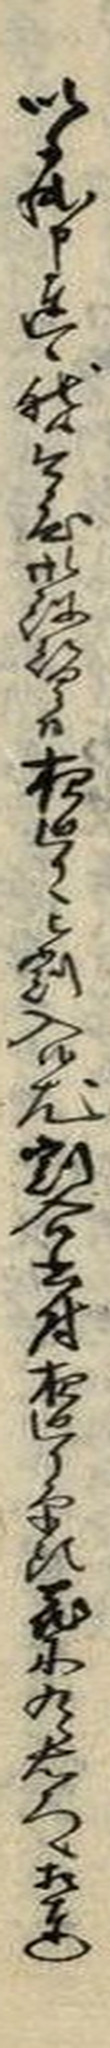以手紙申達候然は今度御役替に付夜廻りへ被割入候尤割合書付夜廻り筆頭花木九郎右衛門へ相達
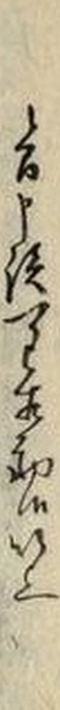候間申談可被相勤候以上
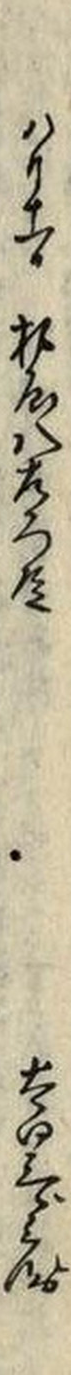八月十一日杤屋八左衛門殿太田三郎兵衛
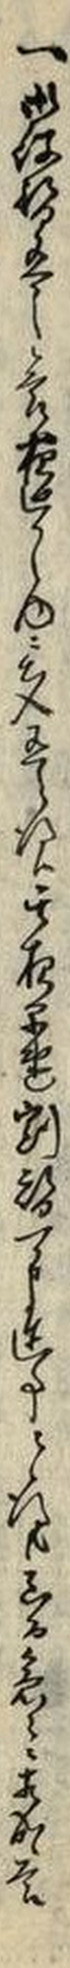一御役替有之候節夜廻り之内に出入有之候得は其夜早速割替可申達事に候得共至て急々に相成候節
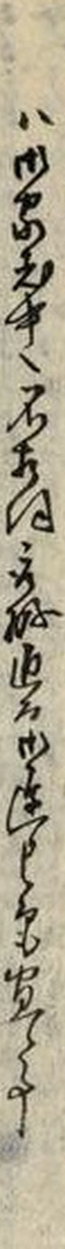は御家老中へ不相伺取扱追て御達申候ても宜候事
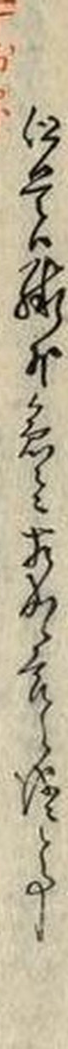但是は殊之外急々に相成候節之儀に候事
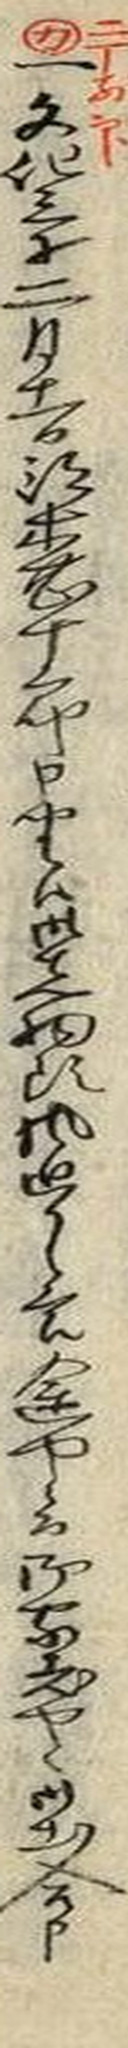一文化三刁二月十一日鈴木甚十郎申聞候は御先物頭風廻り之節途中にて御家老中へ御出合申
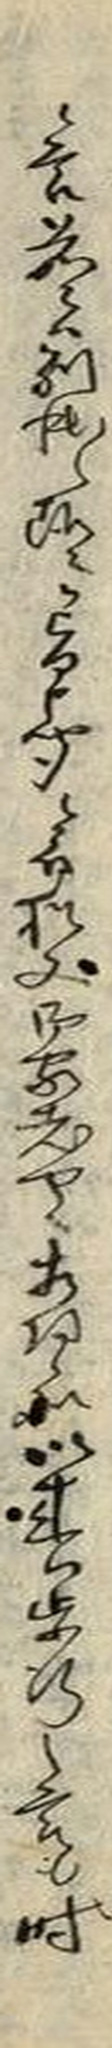候節前々は別紙之趣に候旨申聞候に付猶又御家老中へ相伺候処以来は歩行之節も時
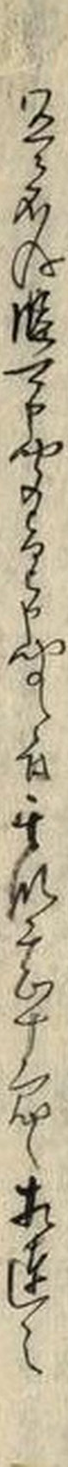宜に不及段可申聞旨被申聞候に付其段甚十郎へ相達之
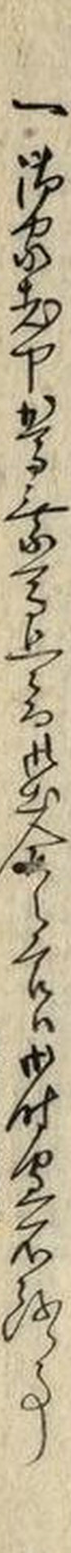一御家老中駕乗馬上にて御出合之節は御時宜不致候事

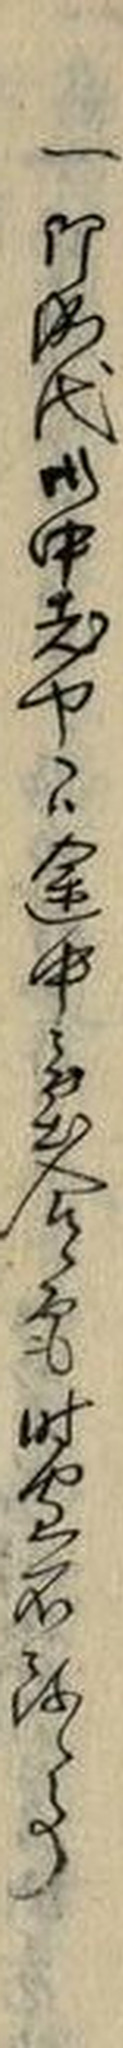一御城代御中老中へは途中にて出合候ても時宜不致候事
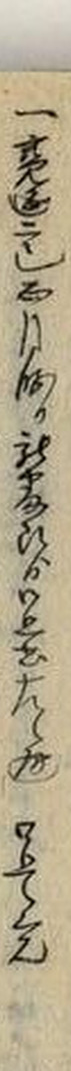一寛延二巳正月晦日新番頭ゟ口上書左之通口上之覚
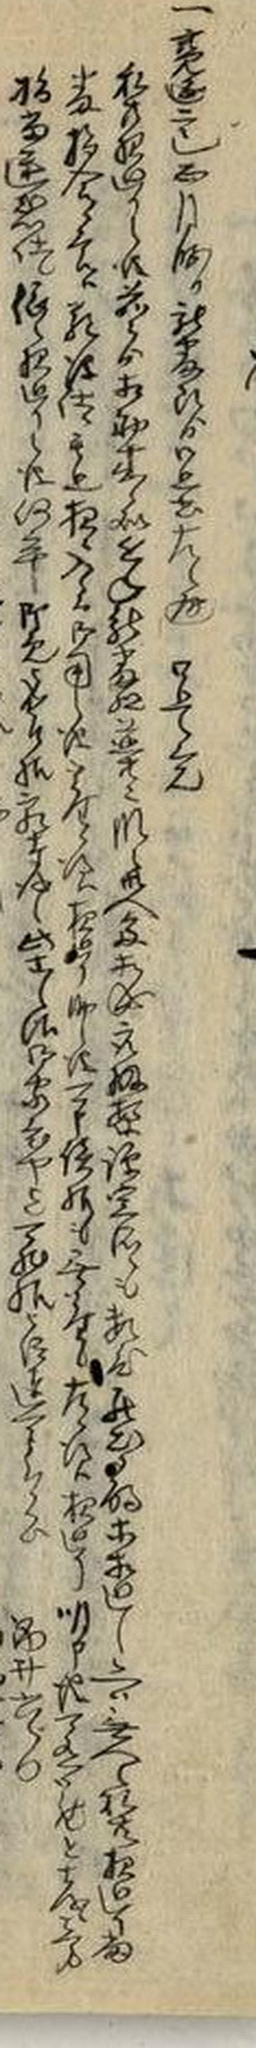私共夜廻り之儀前々ゟ相勤来候処近年新番組並共に段々御人多相成取扱繁評定所へも数度罷出御触等相廻し候へは無人之私共夜廻り当
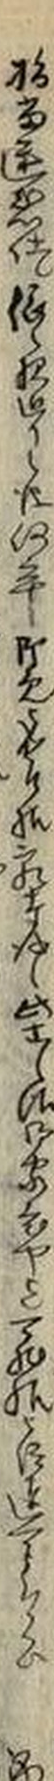指当迷惑仕候依之夜廻り之儀何卒御免被成下候様願奉存候此等之趣御家老中迄可然様被仰達可被下候以上
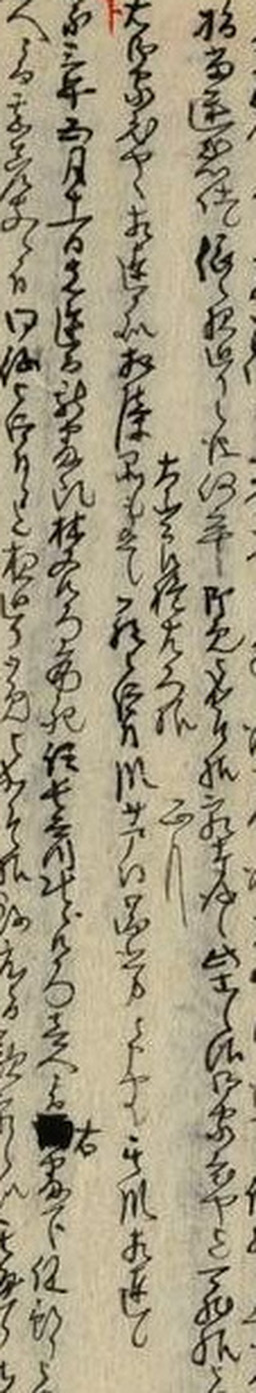右御家老中へ相達候処相障品も有之難被仰付段芦田図書方被申聞其段相達候
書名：御城下諸事之部
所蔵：福井県文書館 Fukui Prefectural Archives
